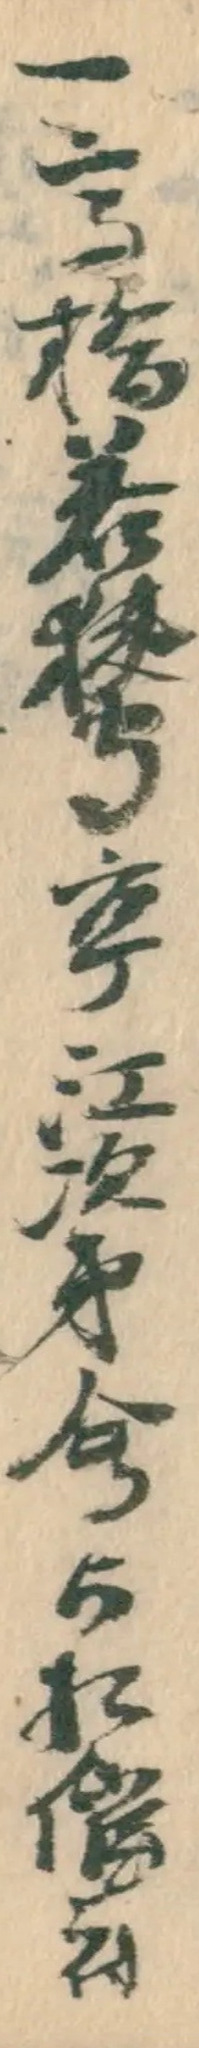一高橋若狭守亨江次第会被相催付
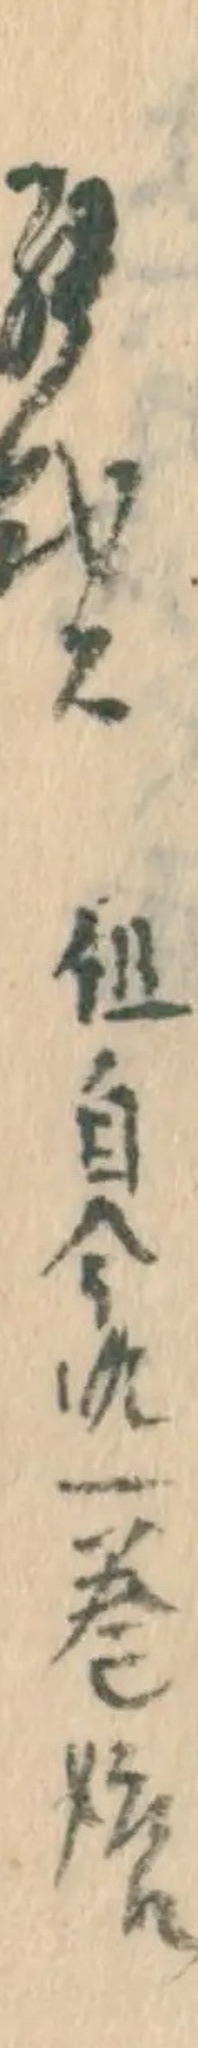罷越ス但自今晩一巻始ル

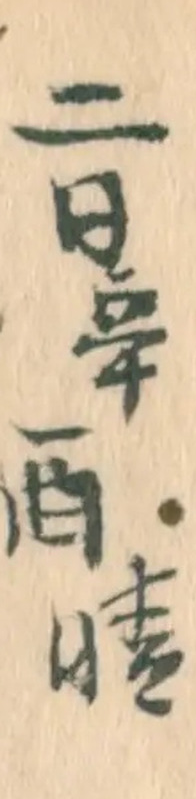二日辛酉晴
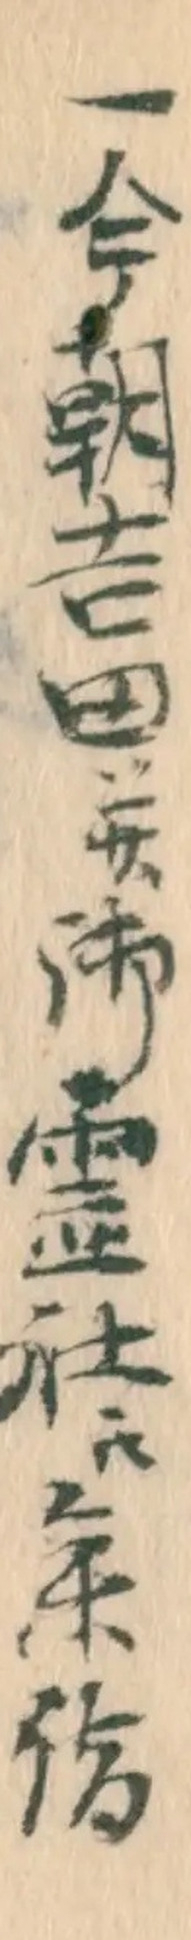一今朝吉田并御霊社え参詣
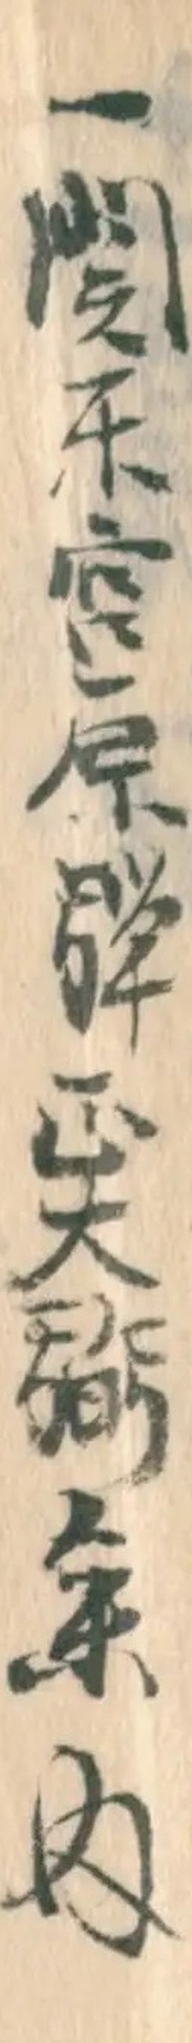一関東宮原弾正大弼参内
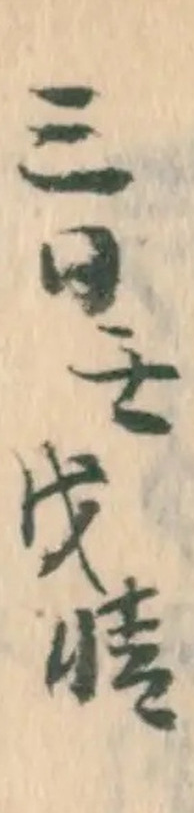三日壬戌晴
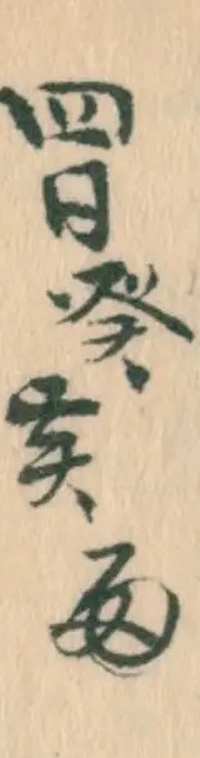四日癸亥雨
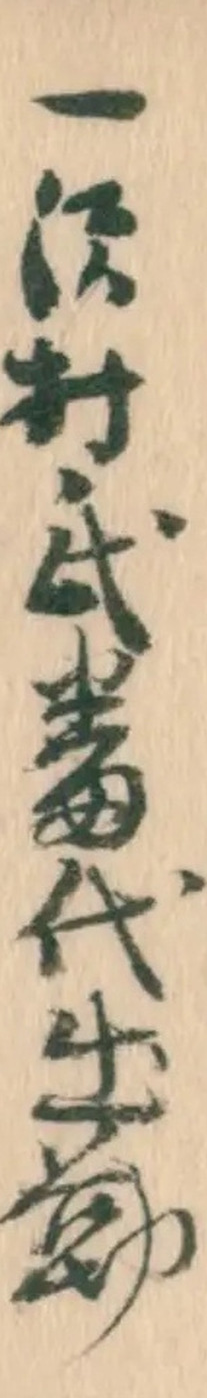一沢村氏番代出勤
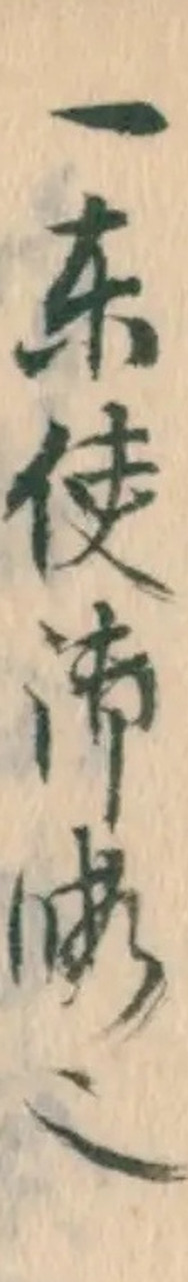一東使御暇也
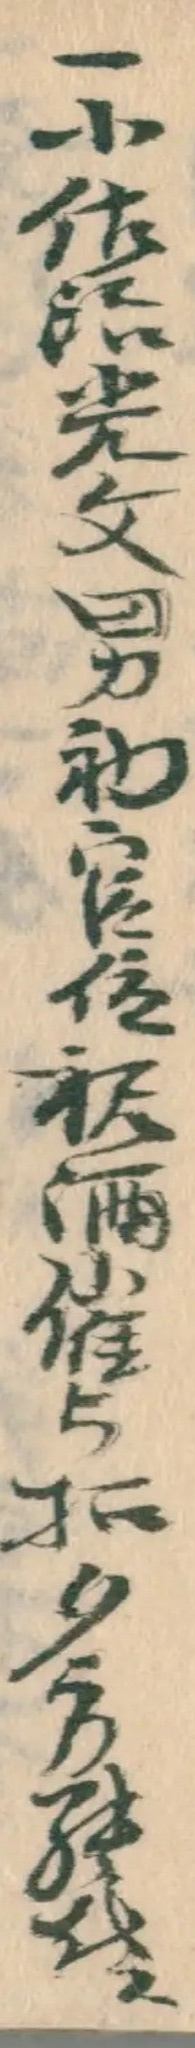一小佐治光文男初官位祝酒催被招夕方罷越ス
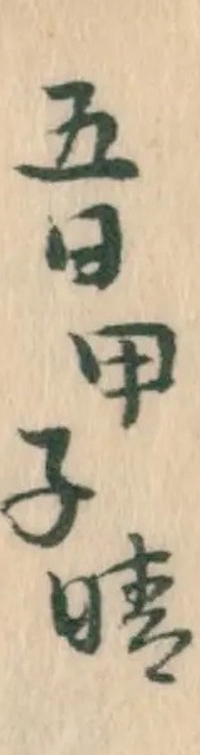五日甲子晴
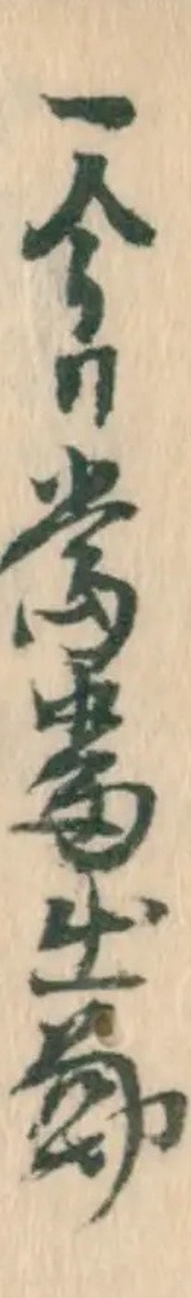一今日当番出勤
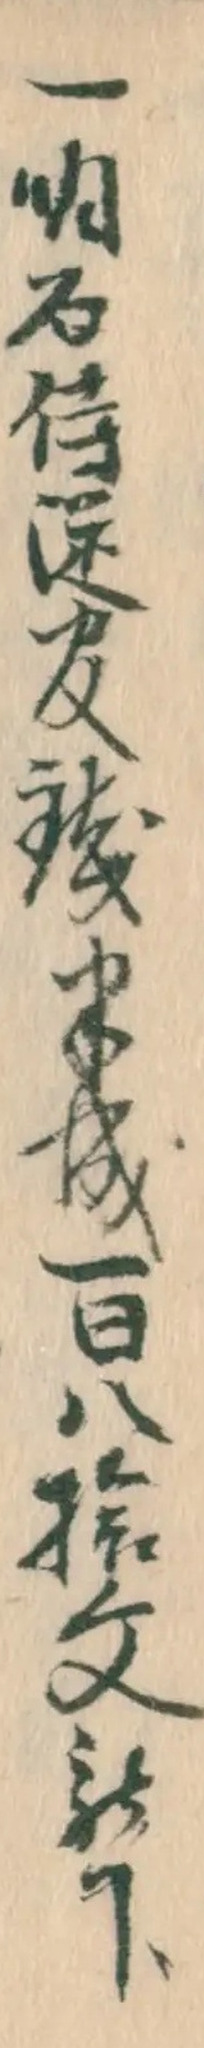一明石侍従官銭半成百八拾文被下
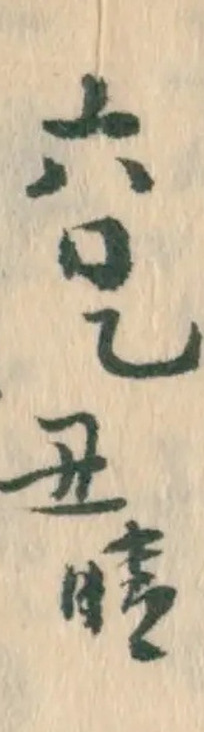六日乙丑晴
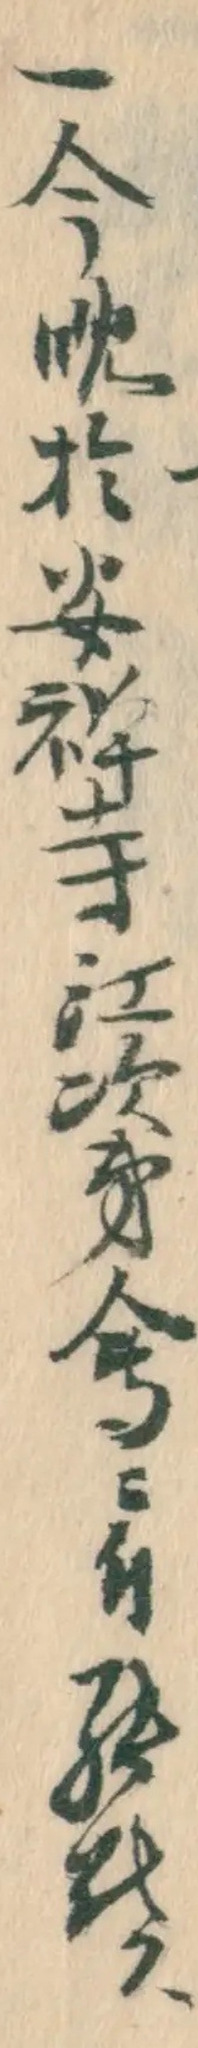一今晩於安禅寺江次第会ニ付罷越ス
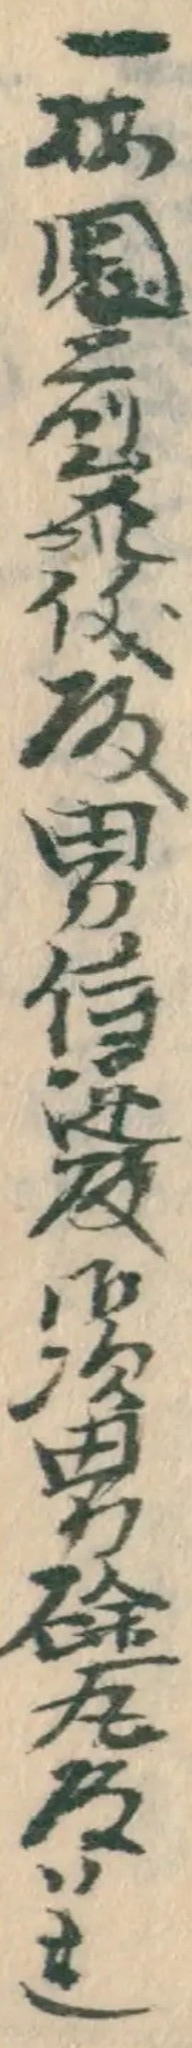一梅園前参議殿男侍従殿御次男碒丸殿御連
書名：禁裏御所御用日記. [131]
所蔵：国立国会図書館 National Diet Library, JAPAN
